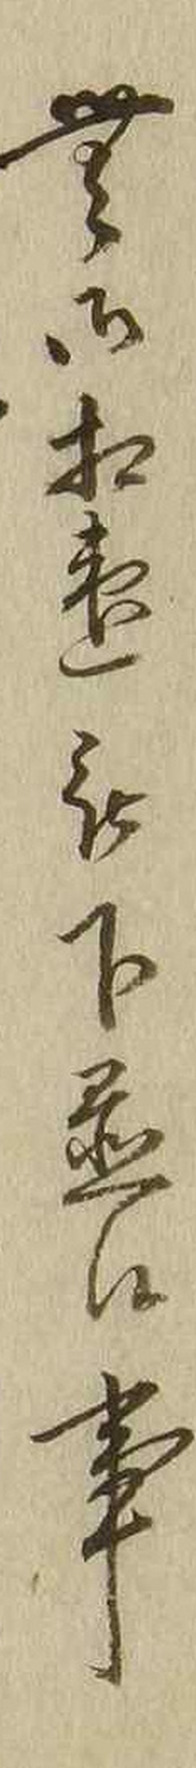無御相違被下置候事
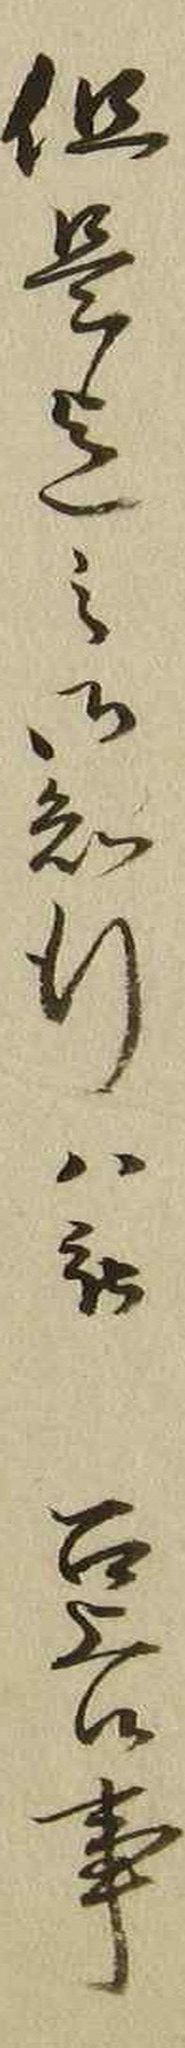但是迄之御知行ハ被召上候事
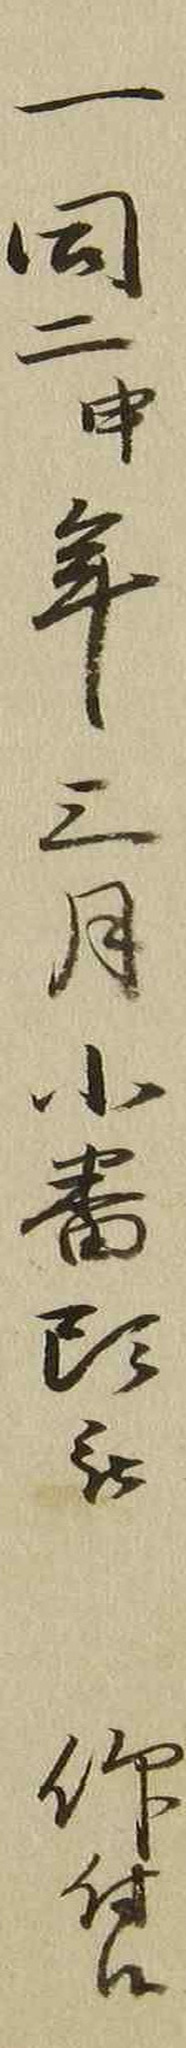一同二申年三月小番頭被仰付候
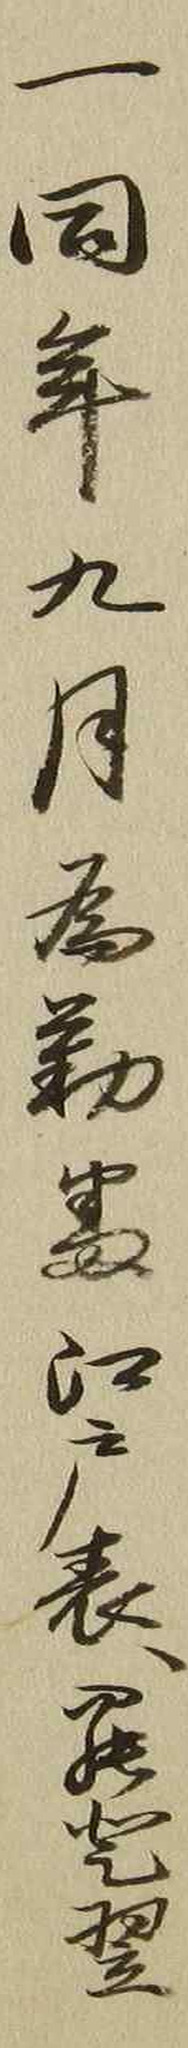一同年九月為勤番江戸表へ罷登翌
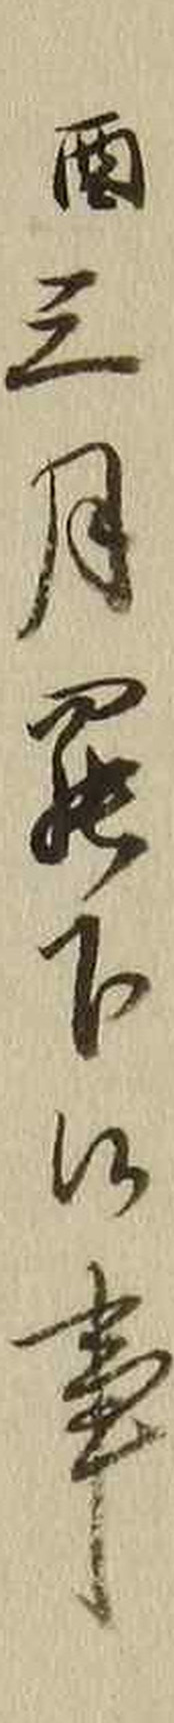酉三月罷下候事
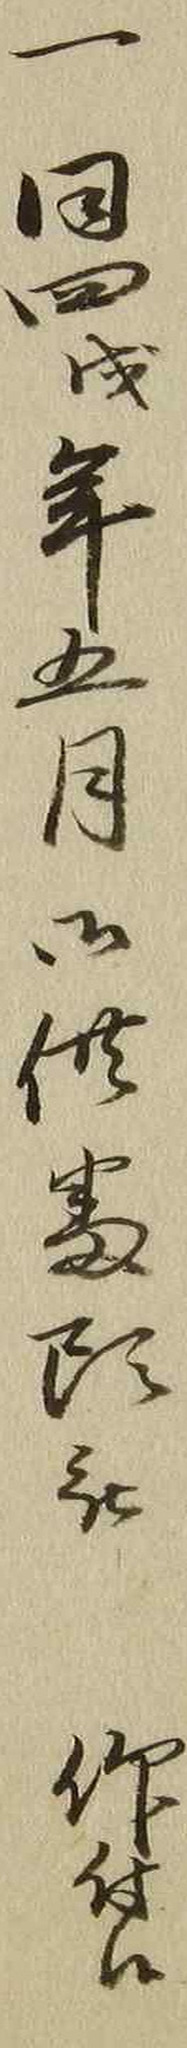一同四戌年五月御供番頭被仰付候
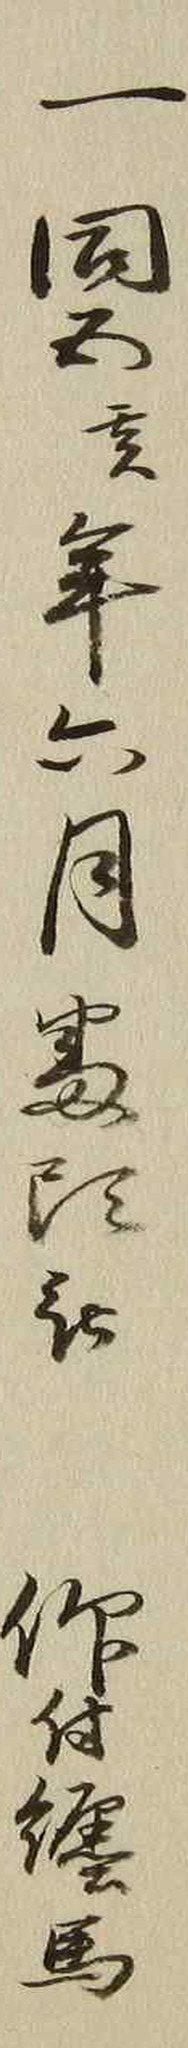一同五亥年六月番頭被仰付纏馬
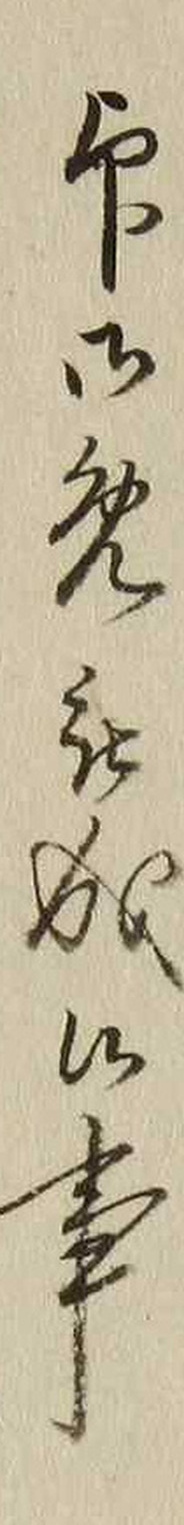印御免被成候事
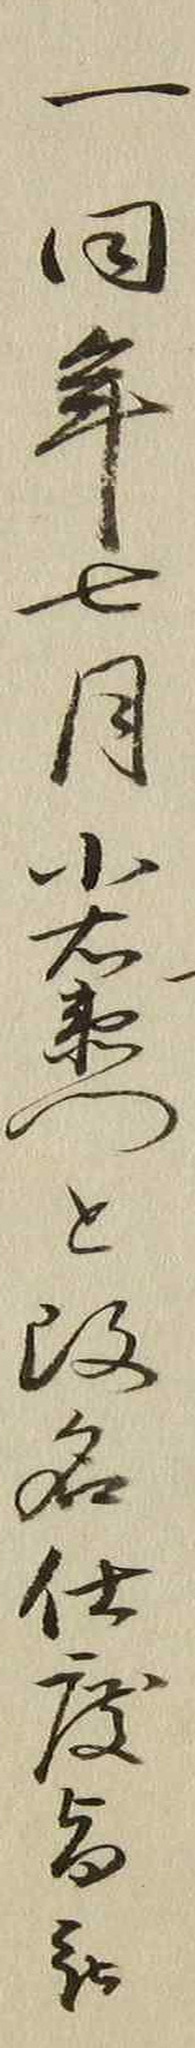一同年七月小右衛門と改名仕度旨被
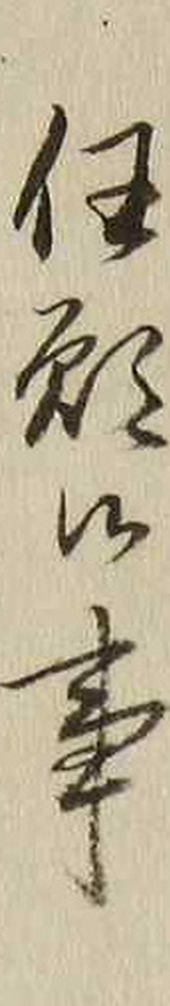任願候事
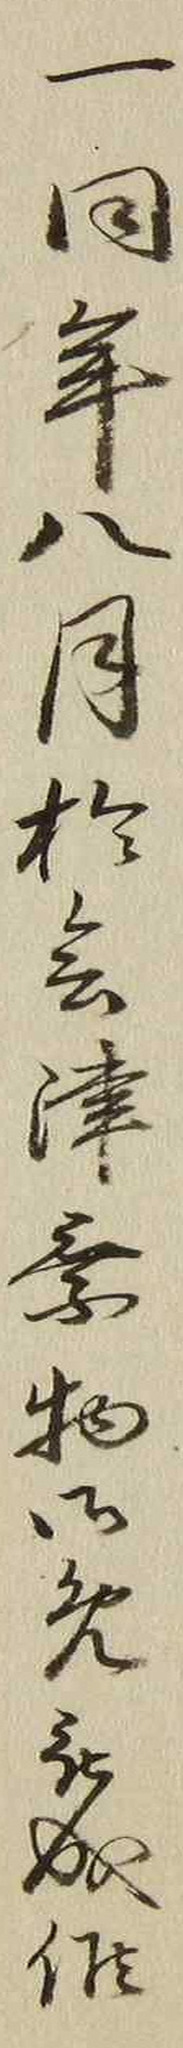一同年八月於会津乗物御免被成候
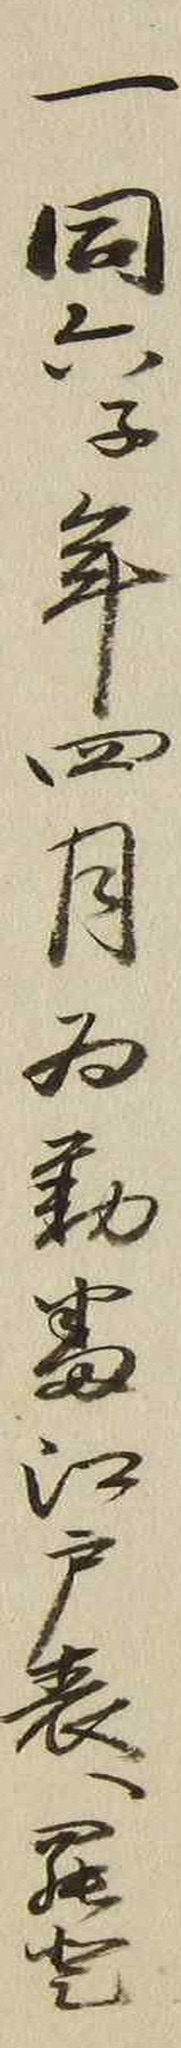一同六子年四月為勤番江戸表へ罷登
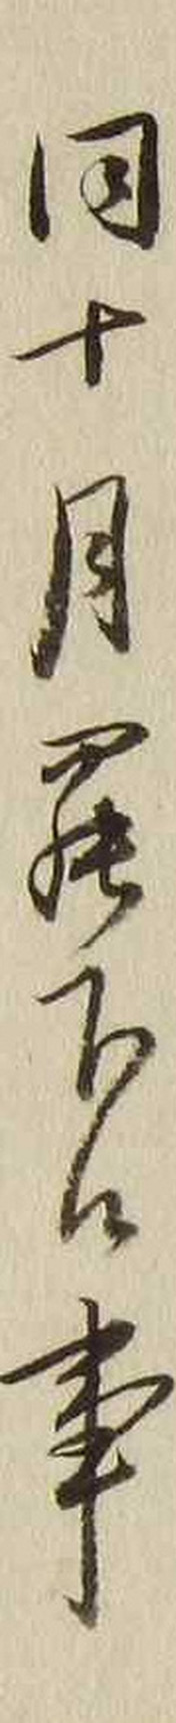同十月罷下候事
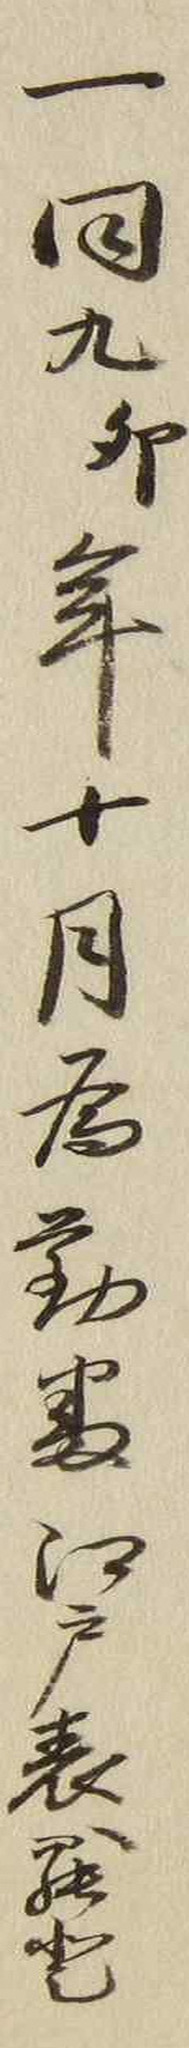一同九卯年十月為勤番江戸表へ罷登
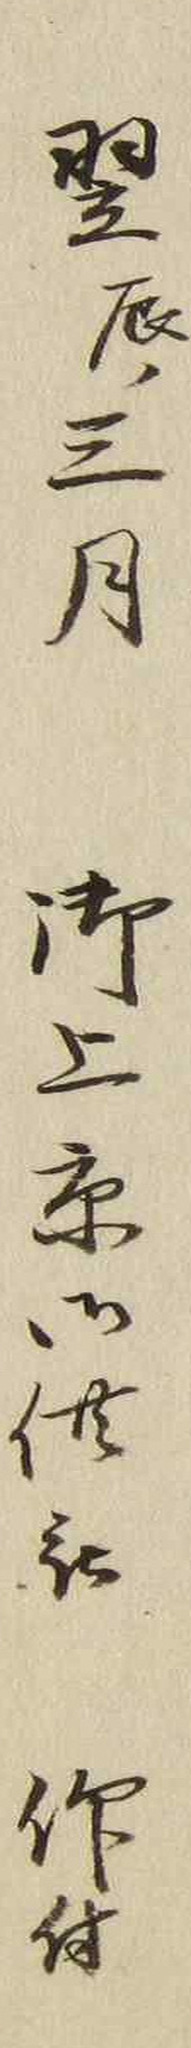翌辰ノ三月御上京御供被仰付

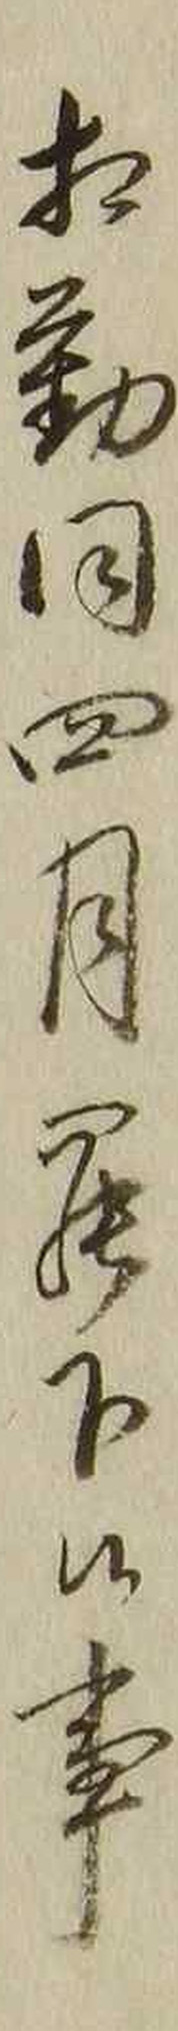相勤同四月罷下事候
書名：諸士系譜　巻之133　た之部9
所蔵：会津若松市立会津図書館
